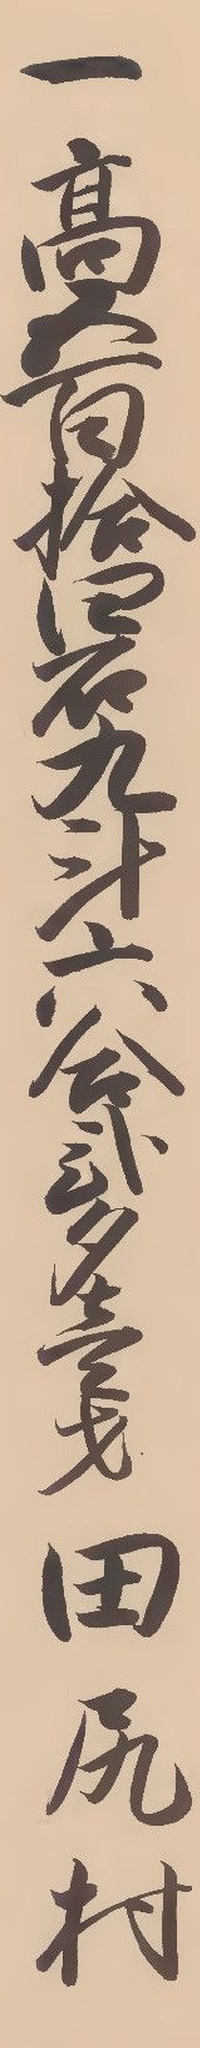一高五百拾四石九斗六合弐勺壱才田尻村
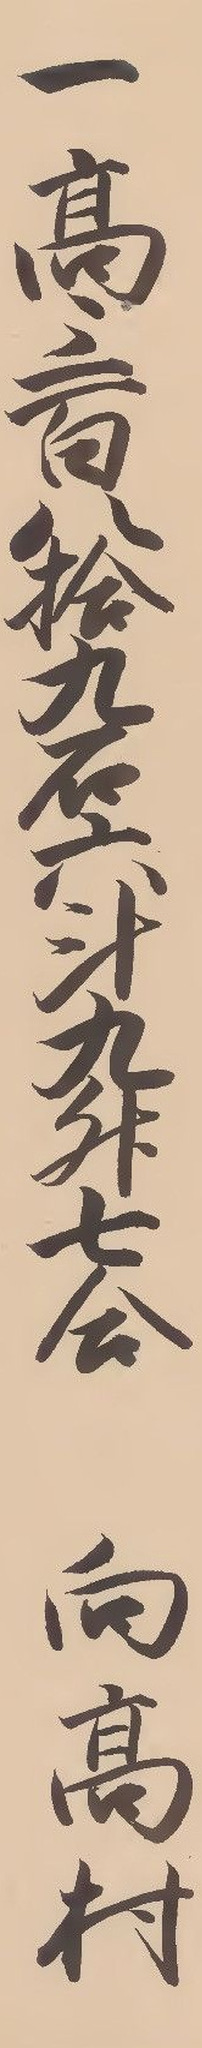一高三百八拾九石六斗九升七合向高村
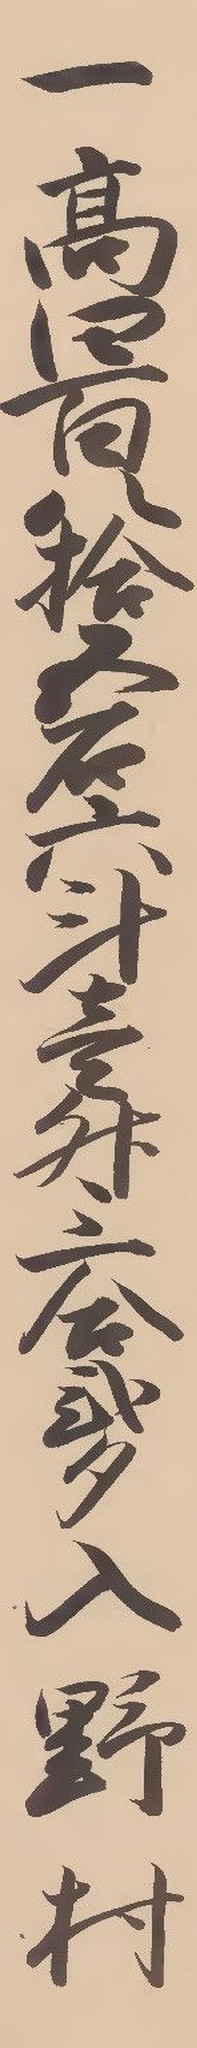一高四百八拾五石六斗壱升三合弐勺入野村
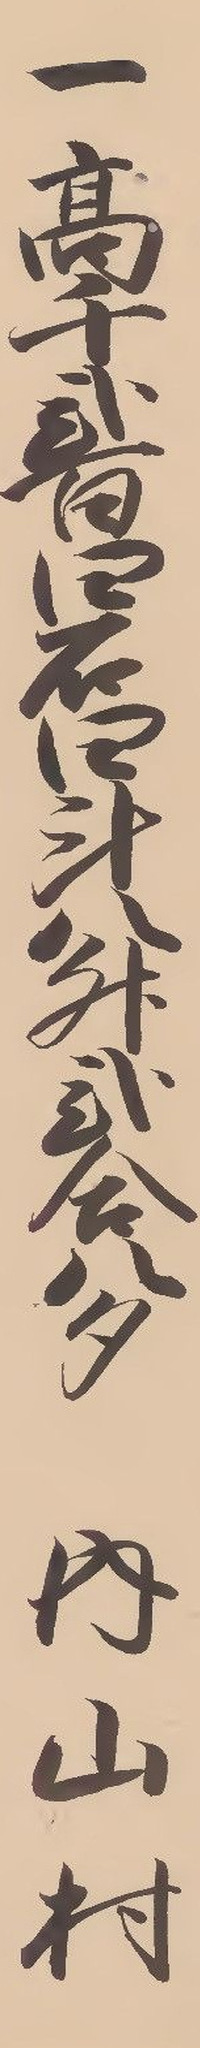一高千弐百四石四斗八升弐合八勺内山村
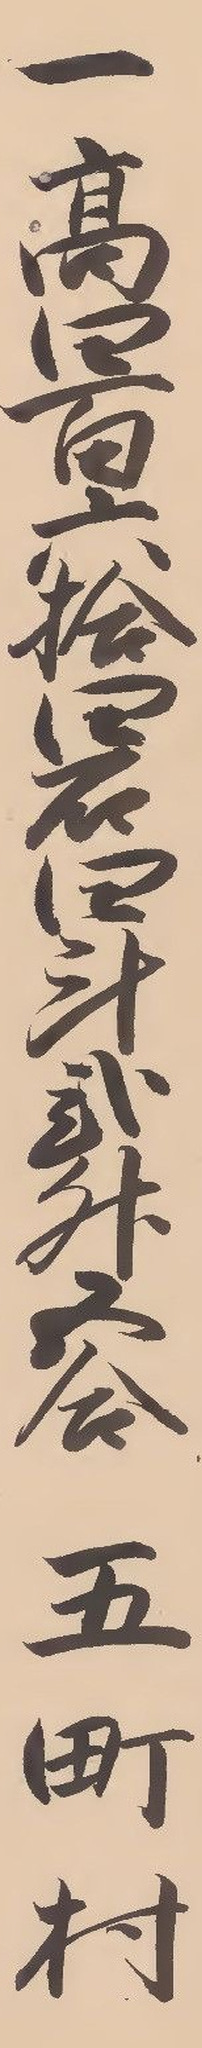一高四百六拾四石四斗弐升五合五町村
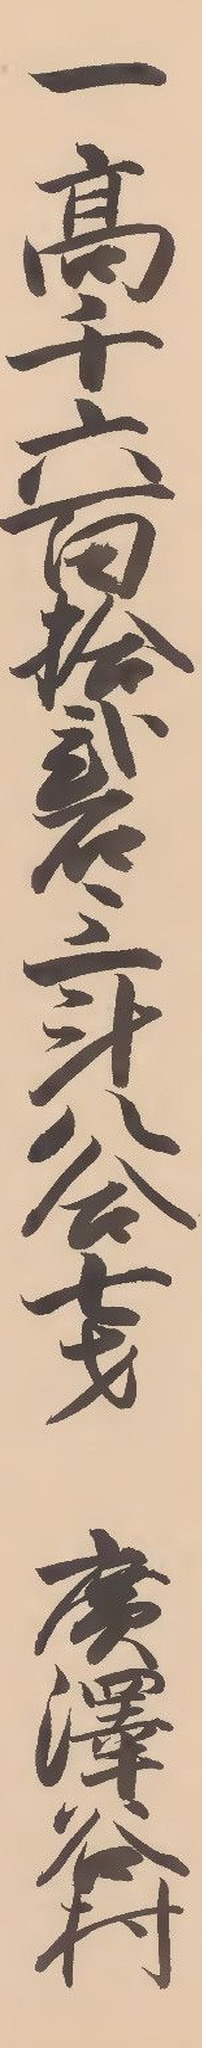一高千六百拾弐石三斗八合七才広沢谷村
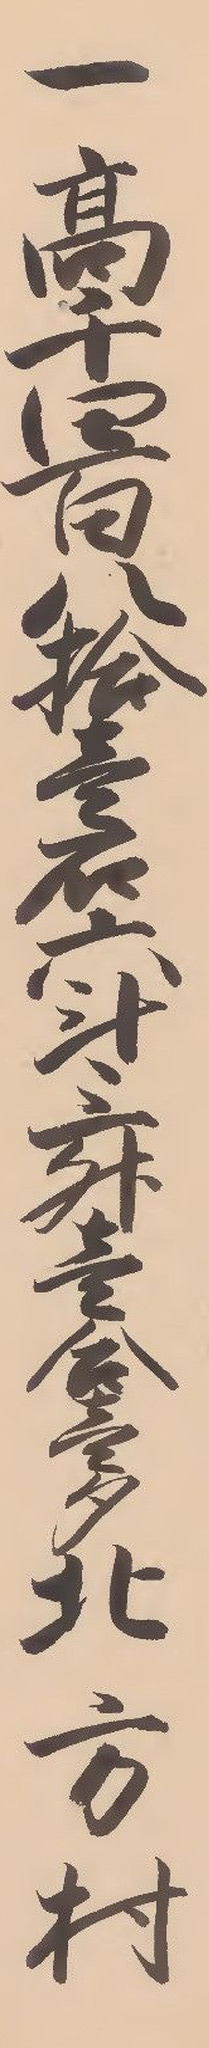一高千四百八拾壱石六斗三升壱合壱勺北方村
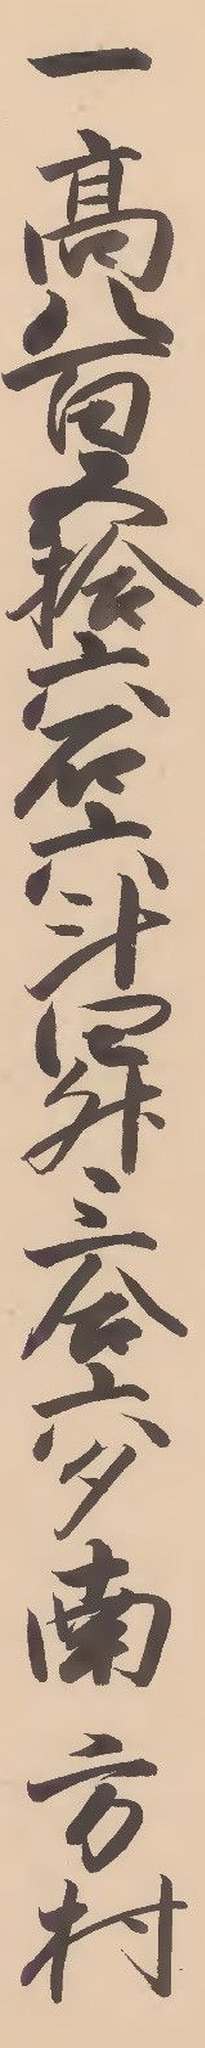一高八百五拾六石六斗四升三合六勺南方村

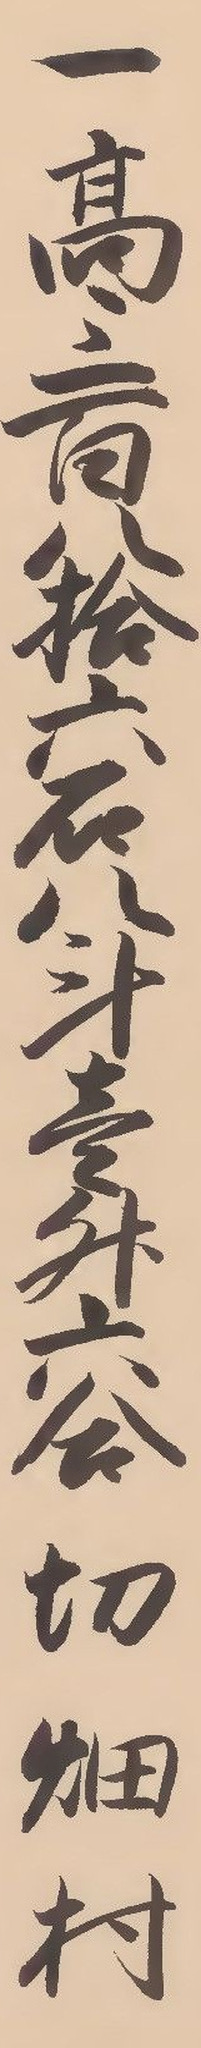一高三百八拾六石八斗壱升六合切畑村
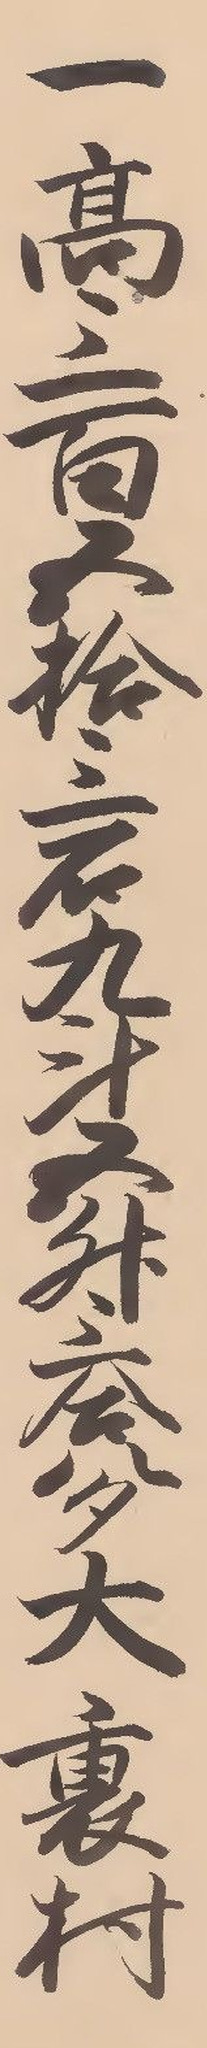一高三百五拾三石九斗五升三合八勺大裏村
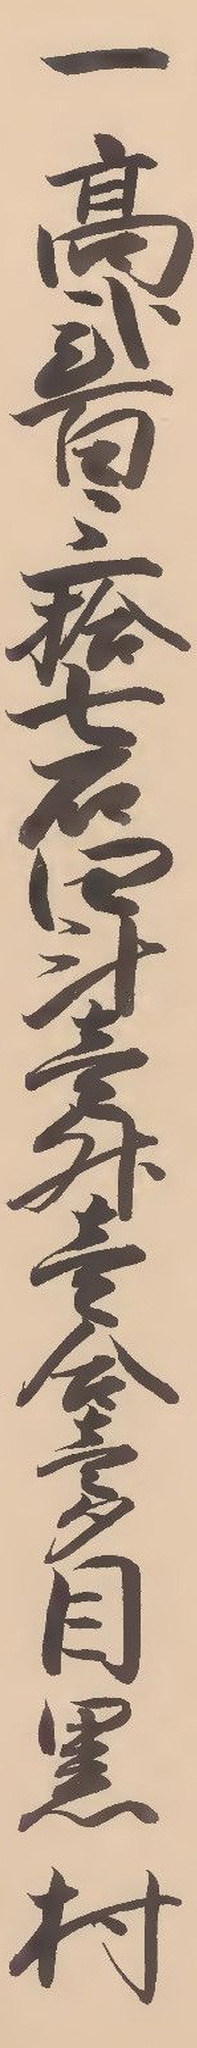一高弐百三拾七石四斗壱升壱合壱勺目黒村
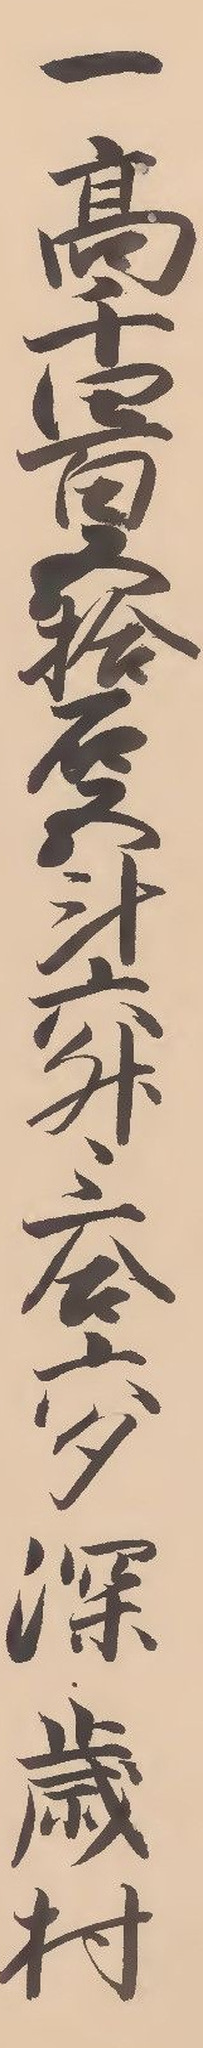一高千四百五拾石五斗六升三合六勺深歳村
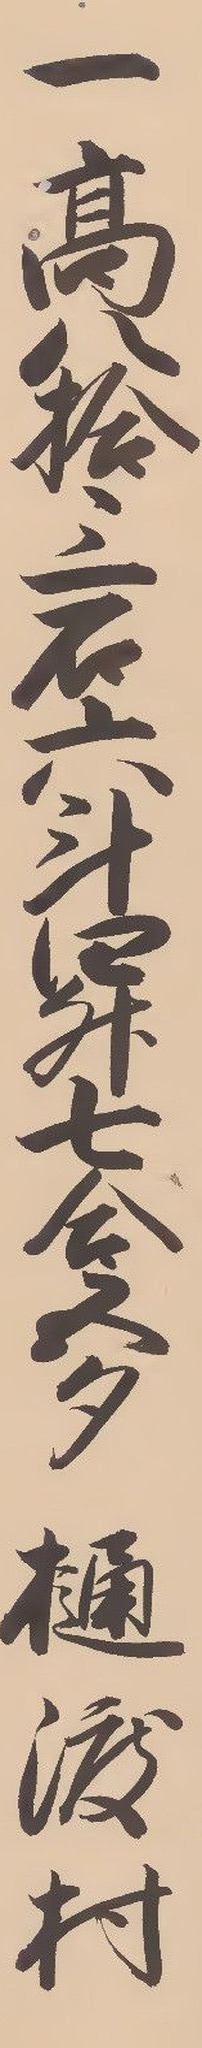一高八拾三石六斗四升七合五勺樋渡村
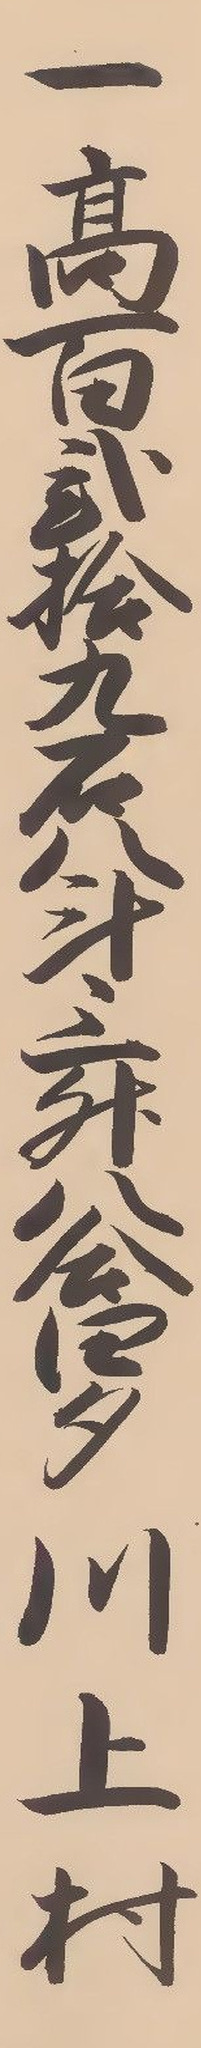一高百弐拾九石八斗三升八合四勺川上村
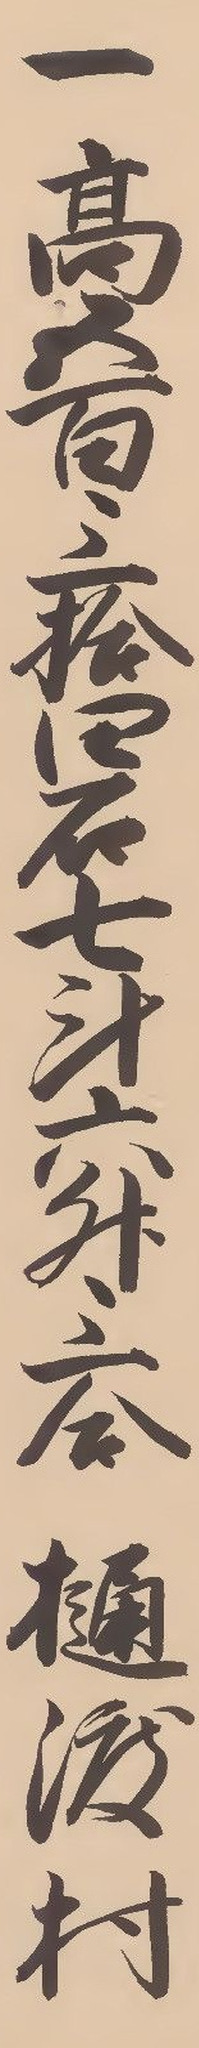一高五百三拾四石七斗六升三合樋渡村
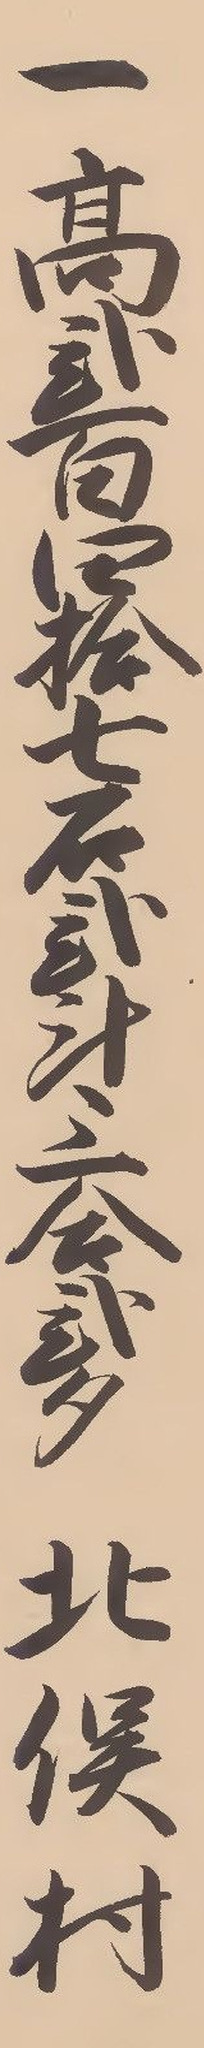一高弐百四拾七石弐斗三合弐勺北俣村
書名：日向国郷帳
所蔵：国立公文書館 National Archives of Japan
